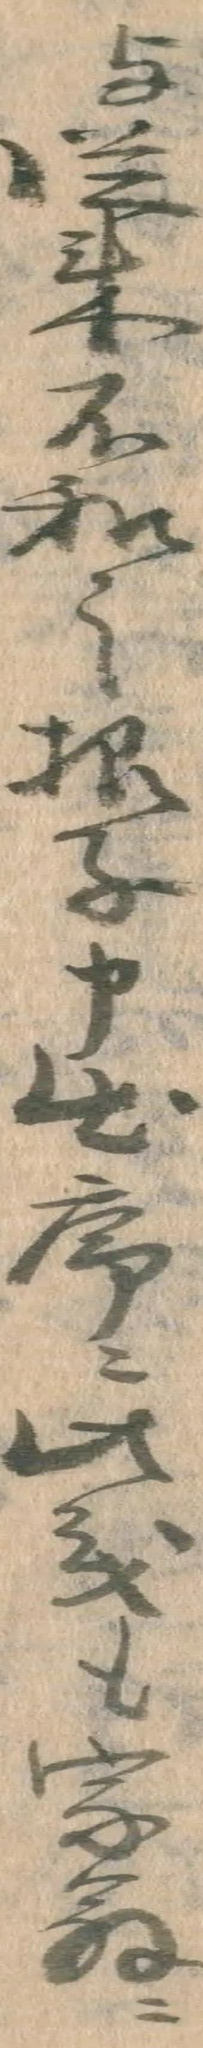与従来不和之様子申出、序に此義も家翁に
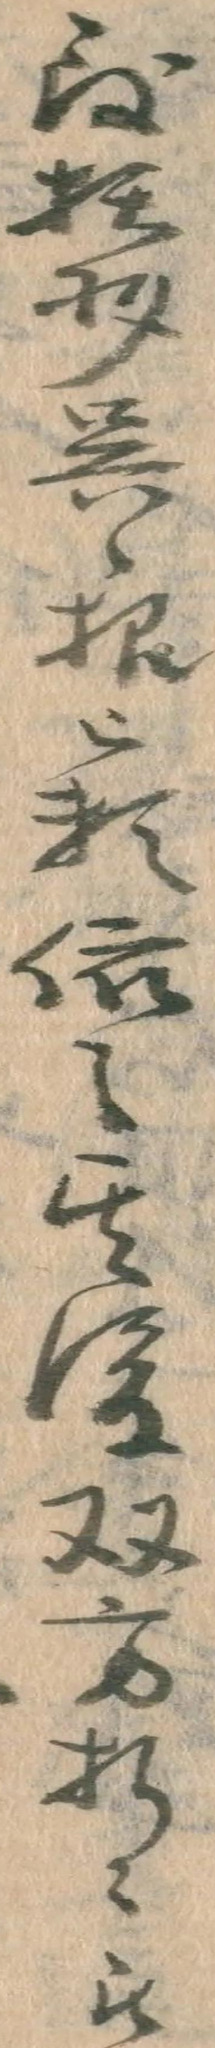致挨拶呉候様被頼、依之其後双方折々被
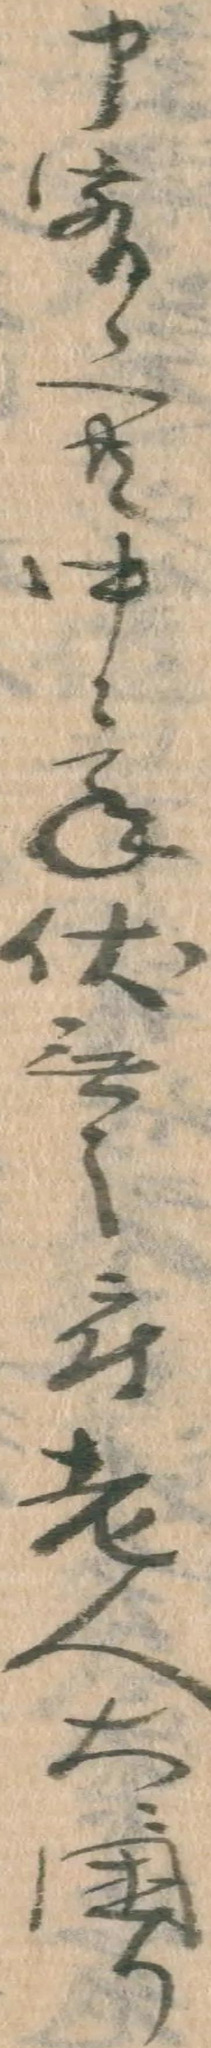申聞候へ共、中々承伏無之ニ付、老人大ニ困り、
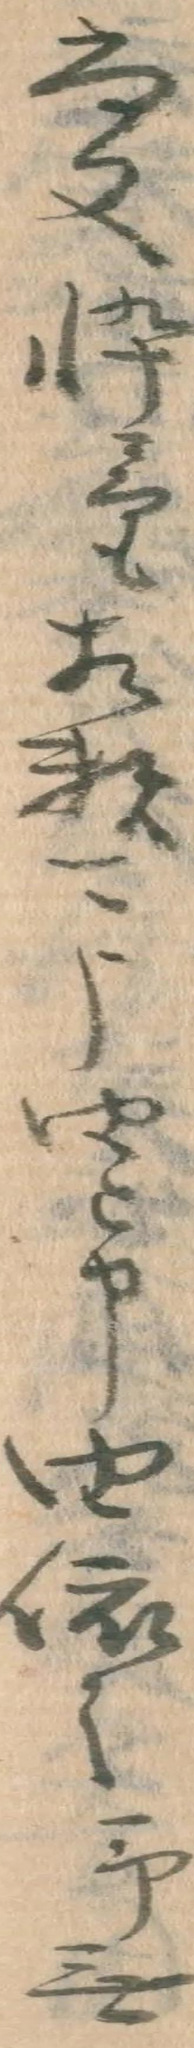尚又忰ニ而も相頼可申由被申由、依之予無
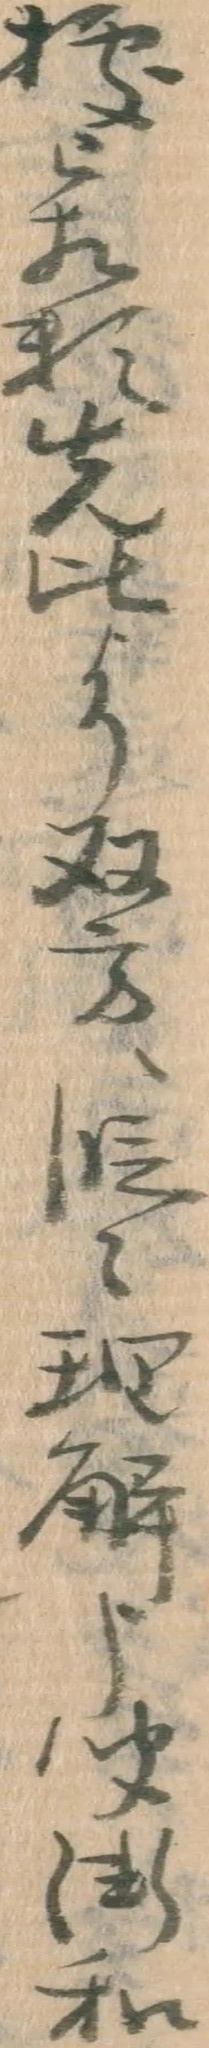拠被相頼、先頃より双方へ段〻理解申聞、漸和
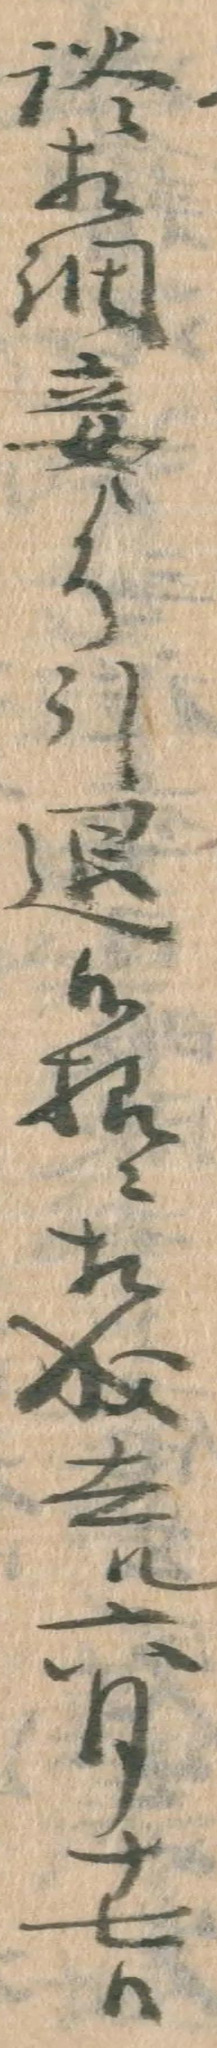談相調、妾より引退候様に相成、去ル六月十七日
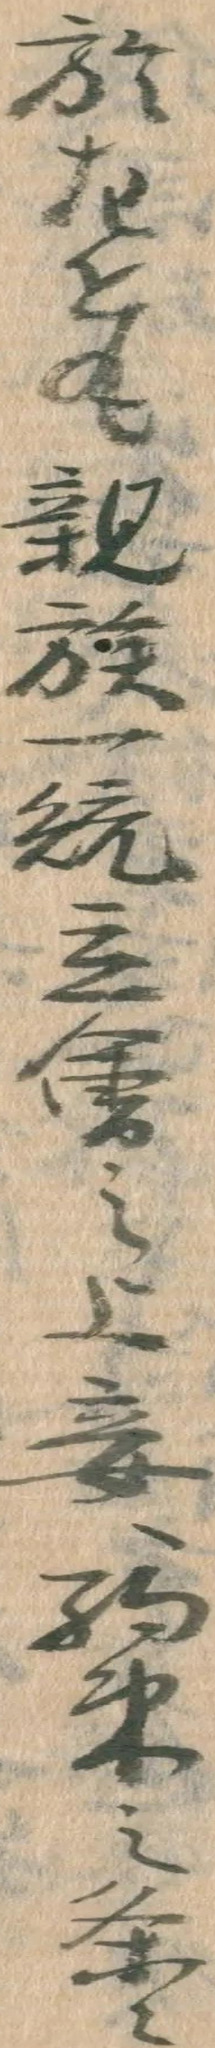於左近丸親族一統立會之上、妾へ約束之条に
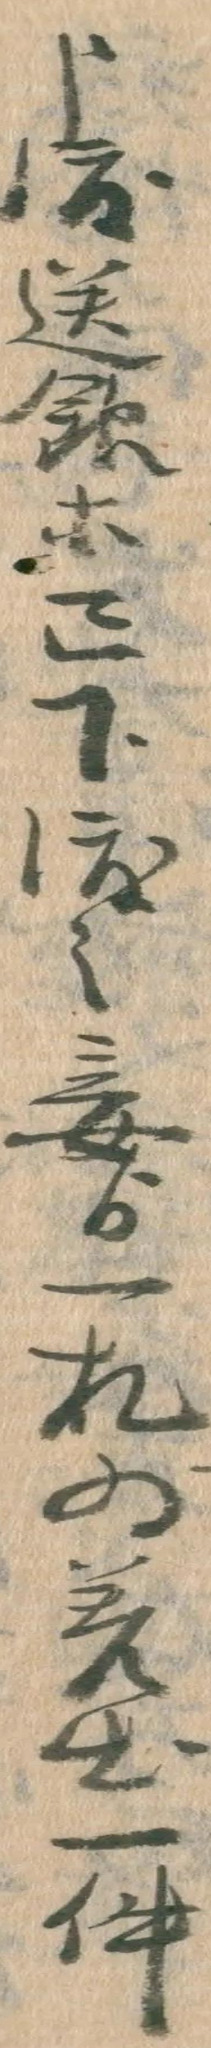申渡、送銀等已下渡之、妾ゟ一札為差出一件
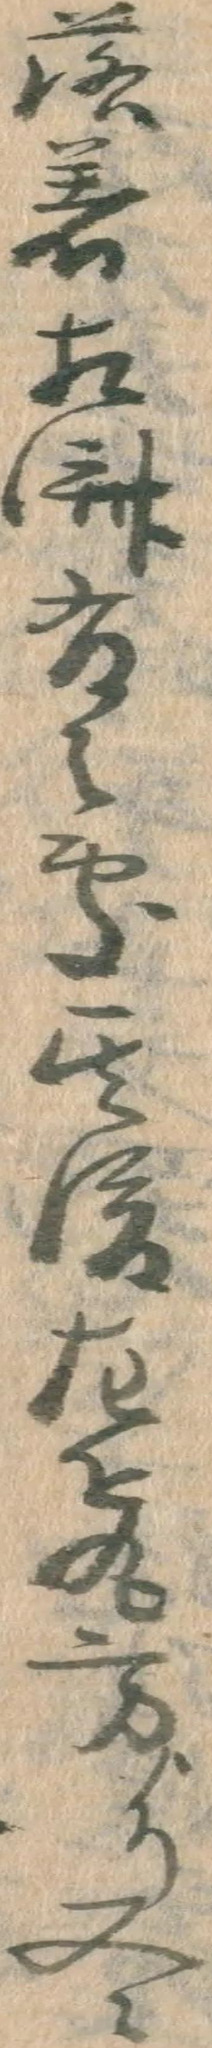落着相済有之處、其後左近丸方より又々
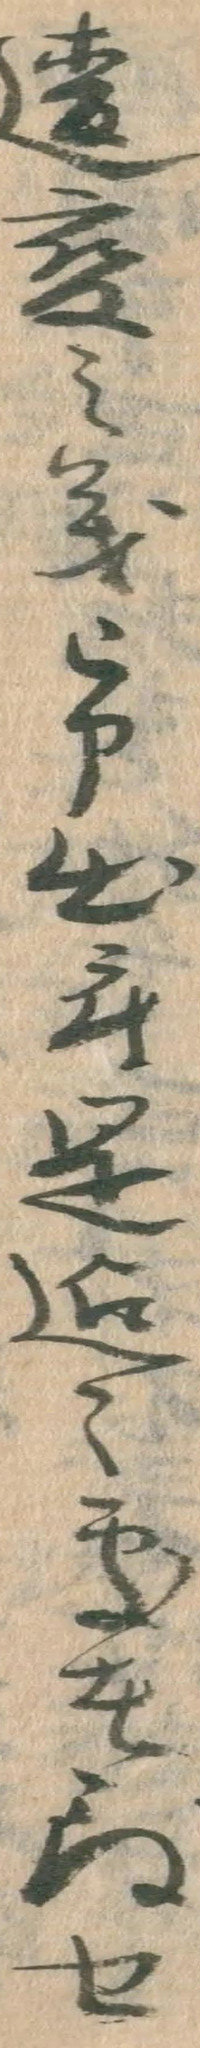違変之義被申出ニ付、是迄之處其後世
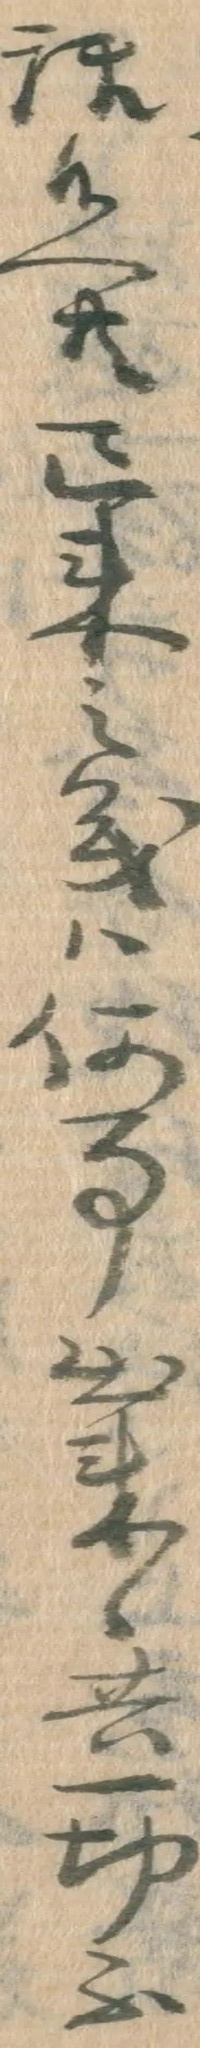話候へ共、已来之義ハ何事出来候共、一切不
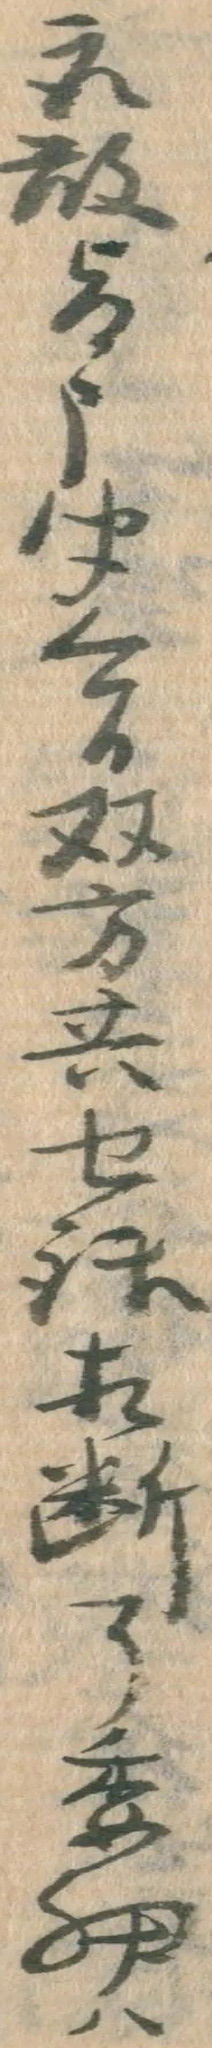取放旨申聞、今日双方共世話相断了、委細ハ
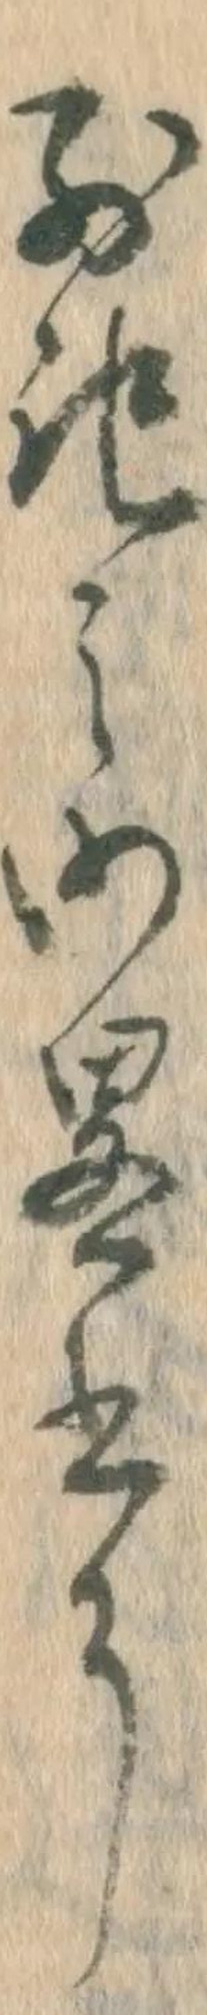別記之如略書了、
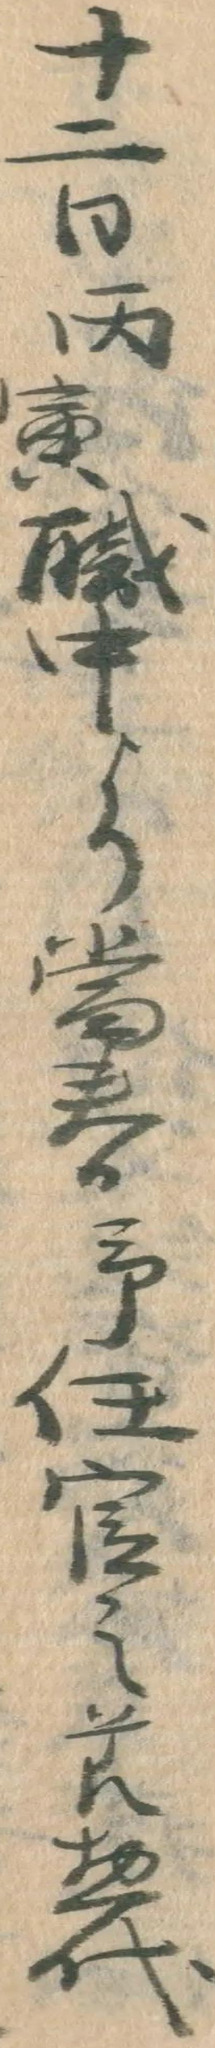十二日丙寅、職中より當春御任官之節、惣代
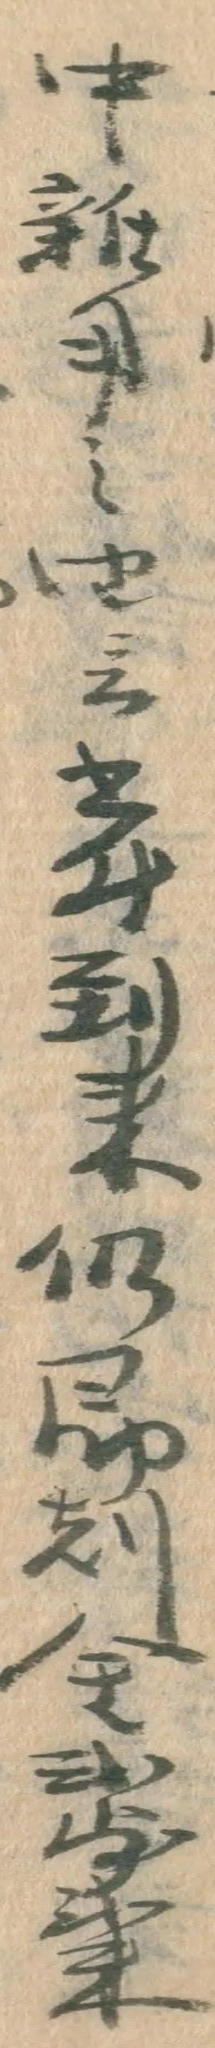中雑用之由ニ而書付到来、仍即刻金弐歩弐朱
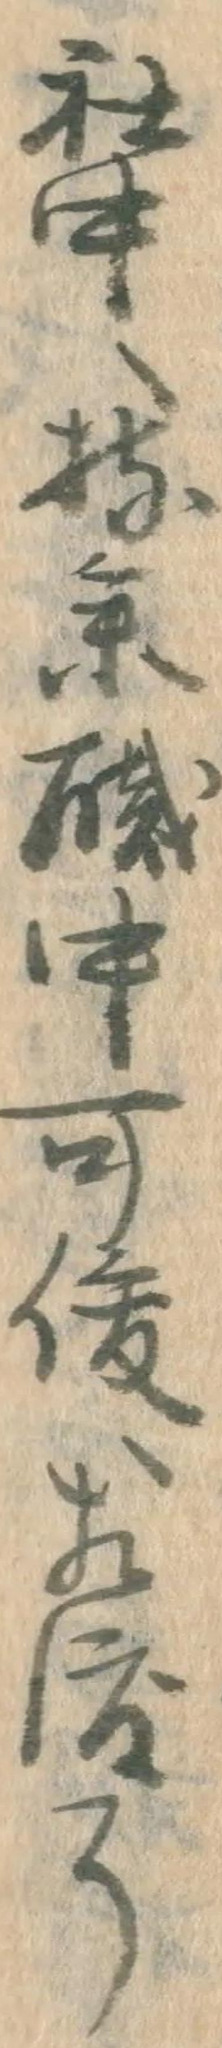社中へ持参、職中可俊へ相渡了、
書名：賀茂社記録. 第63冊
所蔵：国立国会図書館 National Diet Library, JAPAN
